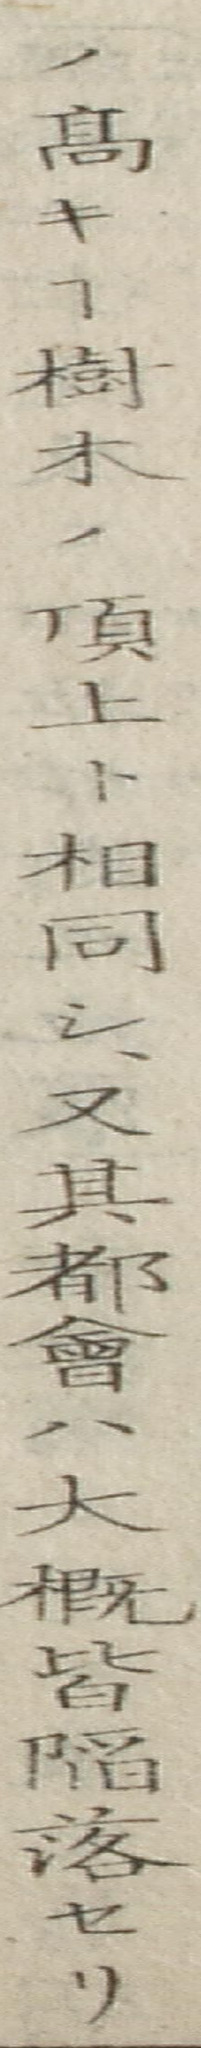ノ高キコト樹木ノ頂上ト相同シ、又其都会ハ大概皆陥落セリ
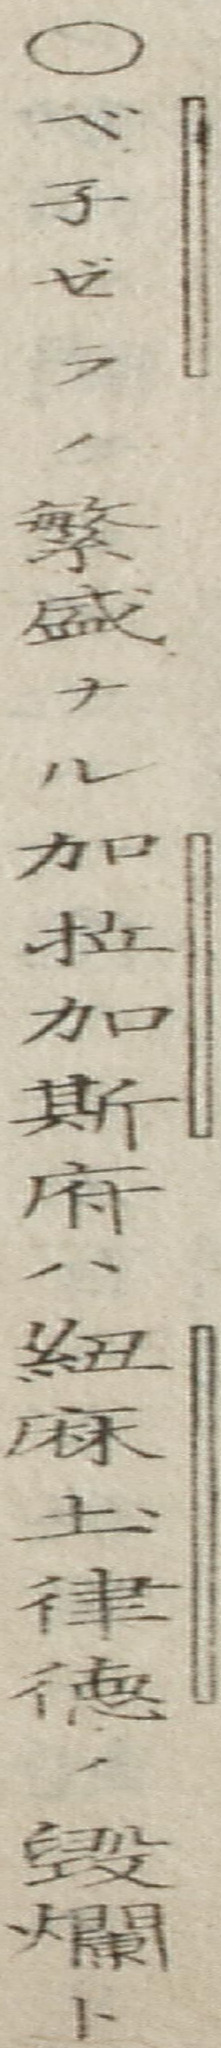○ベ子ゼラノ繁盛ナル加拉加斯府ハ紐麻土律徳ノ毀爛ト
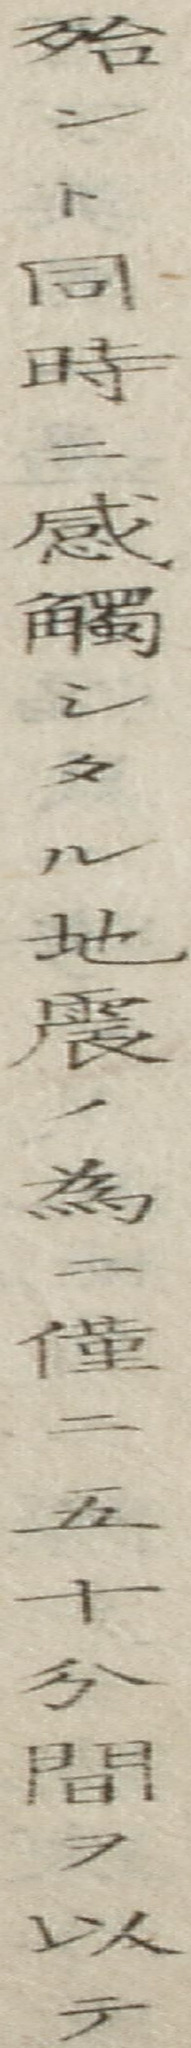殆ント同時ニ感触シタル地震ノ為ニ僅ニ五十分間ヲ以テ
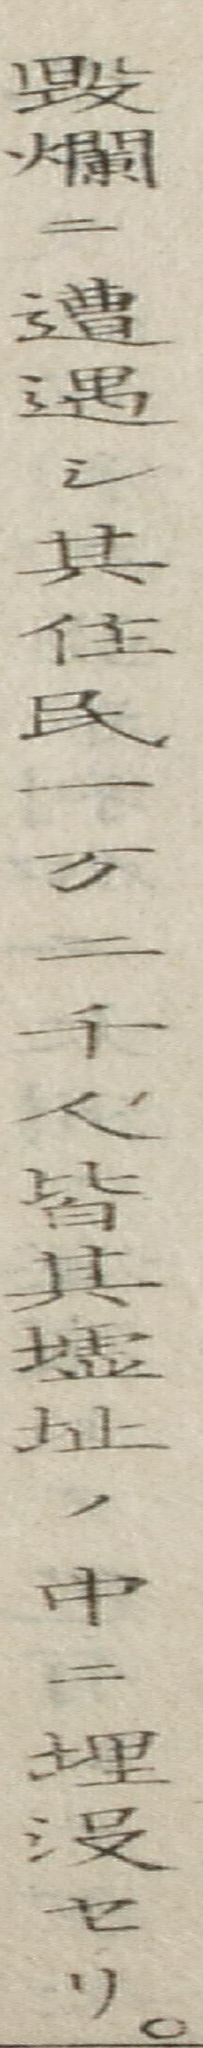毀爛ニ遭遇シ其住民一万二千人皆其墟址ノ中ニ埋没セリ。
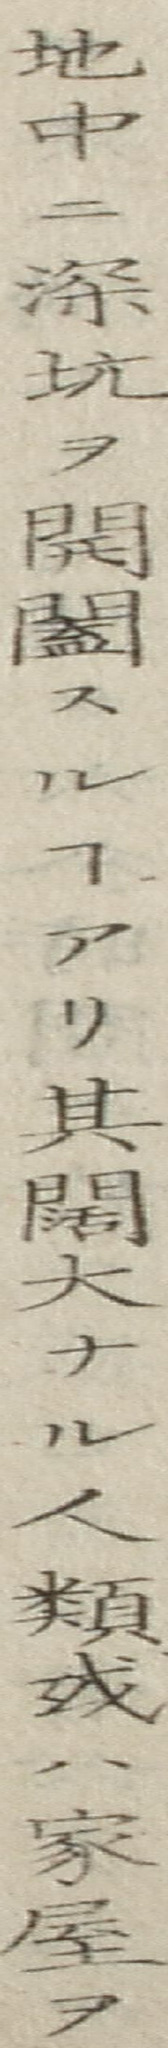地中ニ深坑ヲ開闔スルコトアリ其闊大ナル人類、或ハ家屋ヲ
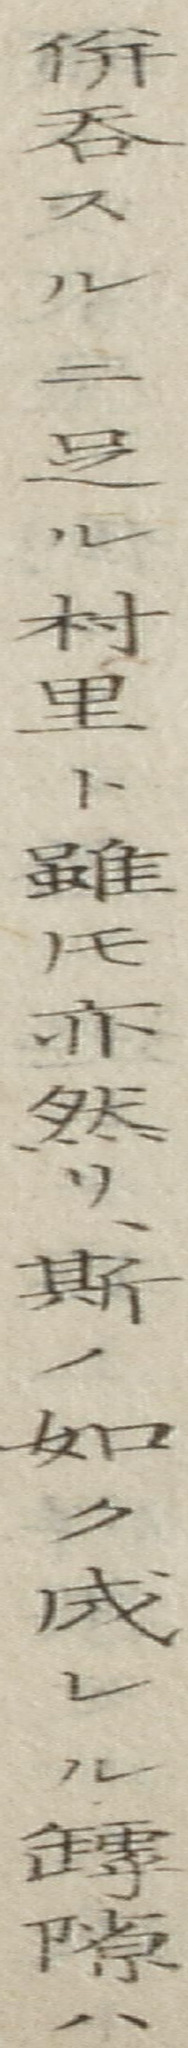併呑スルニ足ル村里ト雖トモ亦然リ、斯ノ如ク成レル罅隙ハ
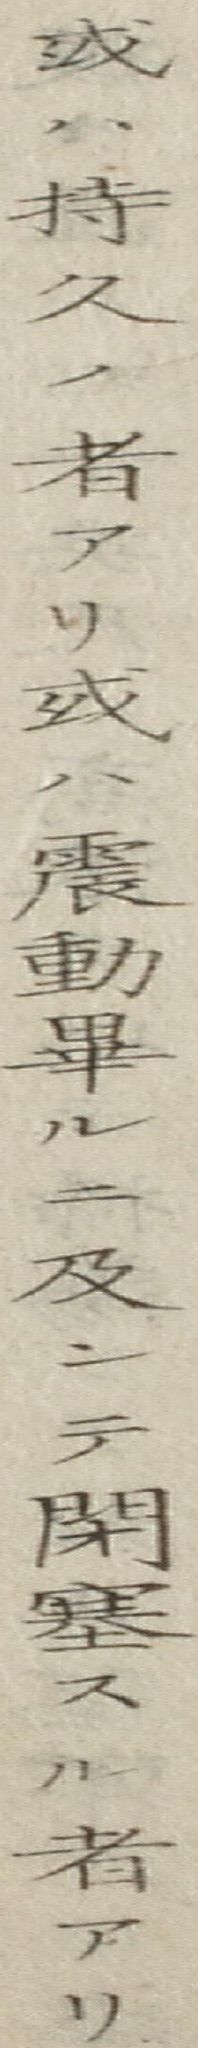或ハ持久ノ者アリ或ハ震動畢ルニ及ンテ閉塞スル者アリ
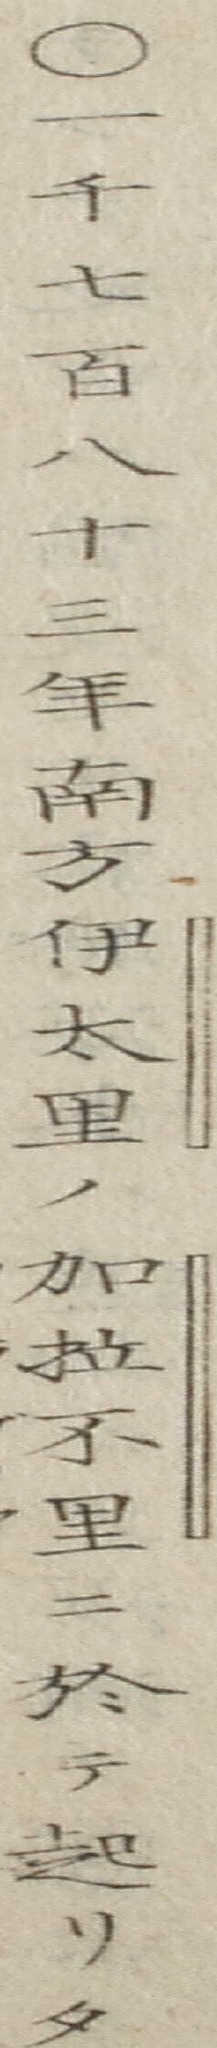○一千七百八十三年南方伊太里ノ加拉不里ニ於テ起リタ
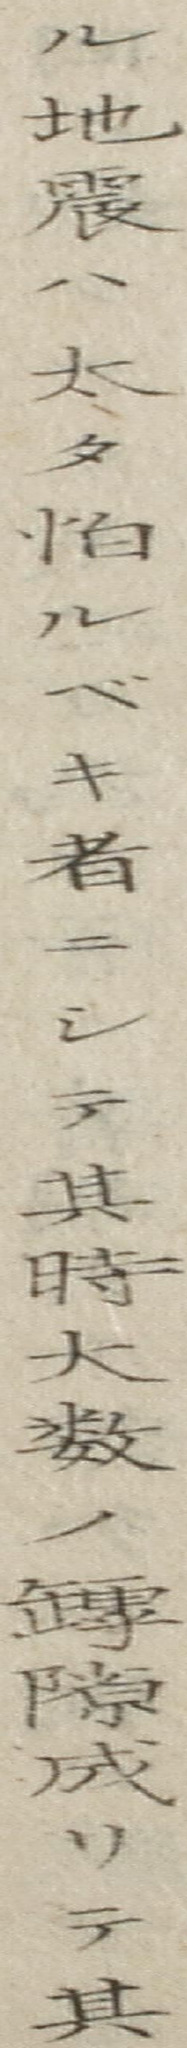ル地震ハ太タ怕ルベキ者ニシテ其時大数ノ罅隙成リテ其
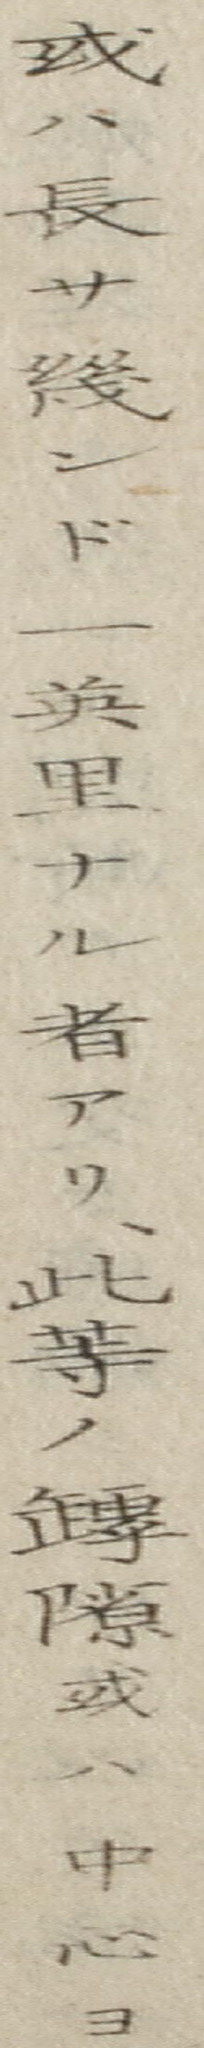或ハ長サ幾ンド一英里ナル者アリ、此等ノ罅隙或ハ中心ヨ
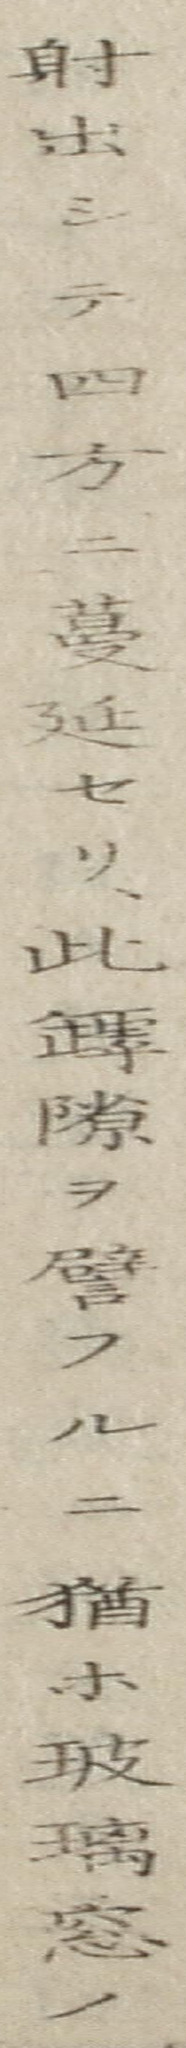射出シテ四方ニ蔓延セリ、此罅隙ヲ譬フルニ猶ホ玻璃窓ノ
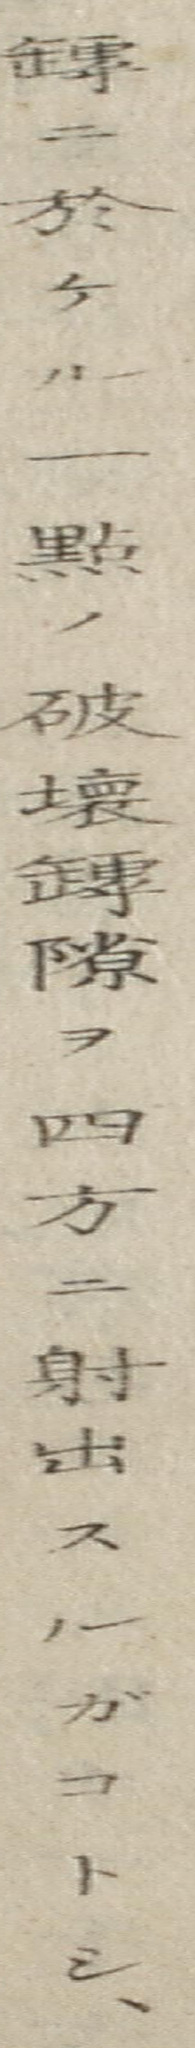罅ニ於ケル一点ノ破壊罅隙ヲ四方ニ射出スルガコトシ、
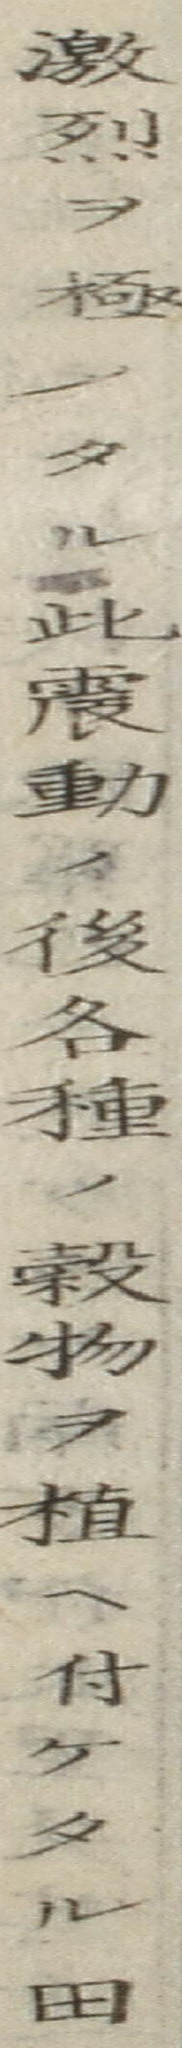激烈ヲ極メタル此震動ノ後各種ノ穀物ヲ植ヘ付ケタル田
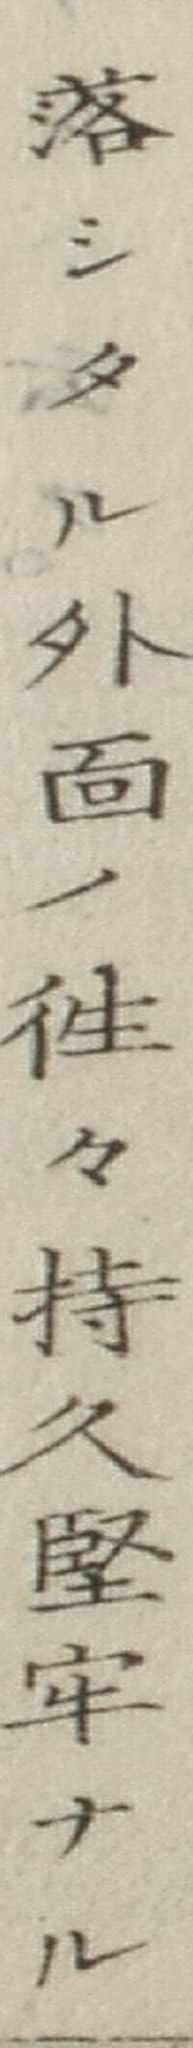落シタル外面ノ往々持久堅牢ナル
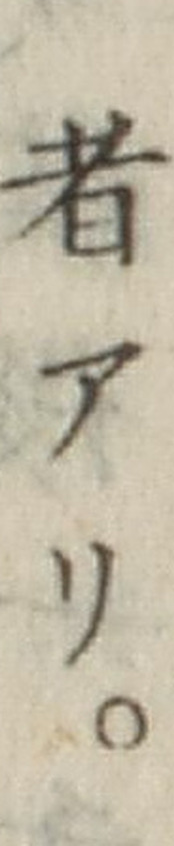者アリ。
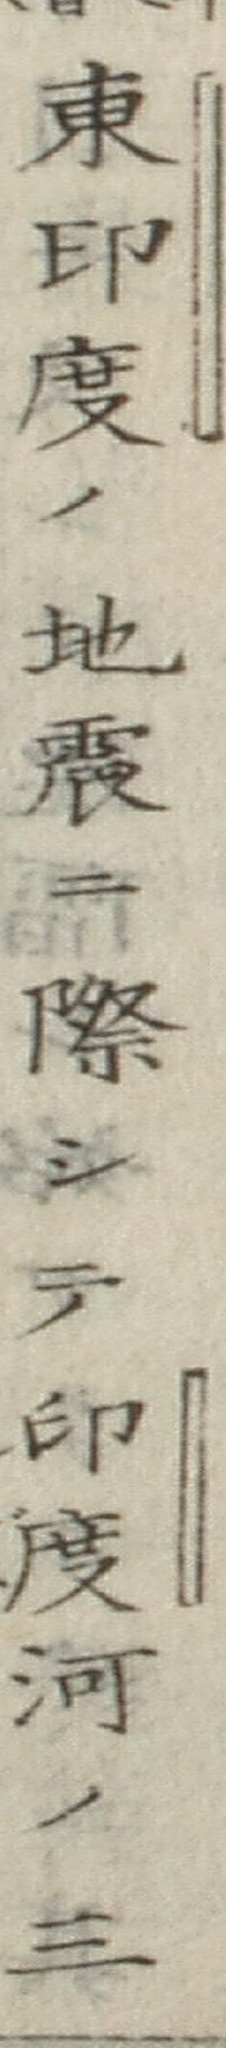東印度ノ地震ニ際シテ印度河ノ三
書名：地形論　巻二
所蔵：東京大学地震研究所図書室 Earthquake Research Institute Library, The University of Tokyo, JAPAN
